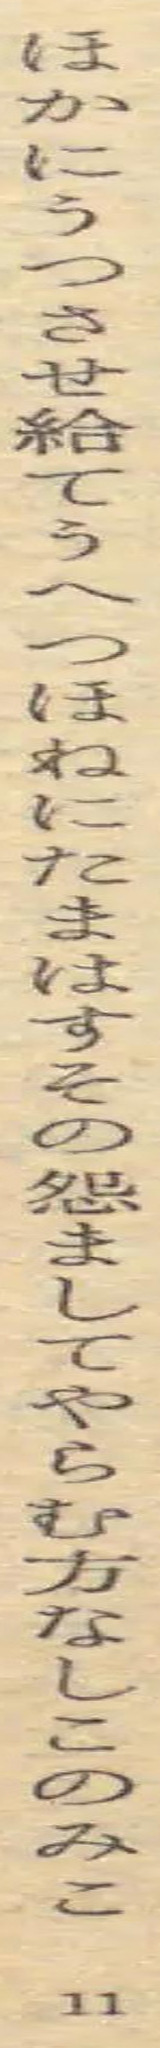ほかにうつさせ給てうへつほねにたまはすその怨ましてやらむ方なしこのみこ
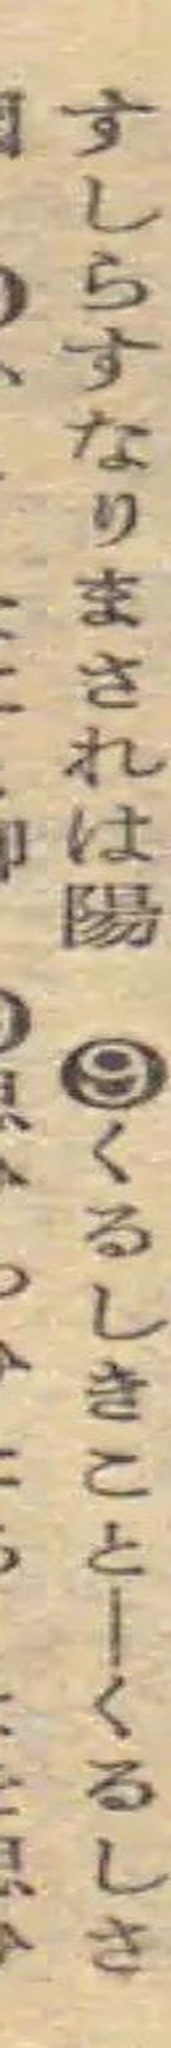すしらすなりまされは陽❾くるしきこと―くるしさ
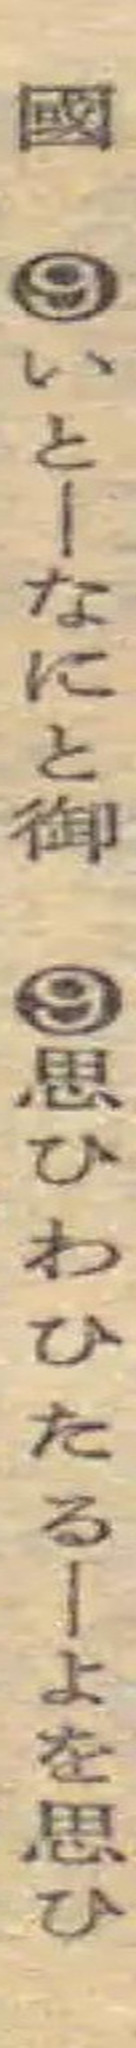国❾いと―なにと御❾思ひわひたる―よを思ひ
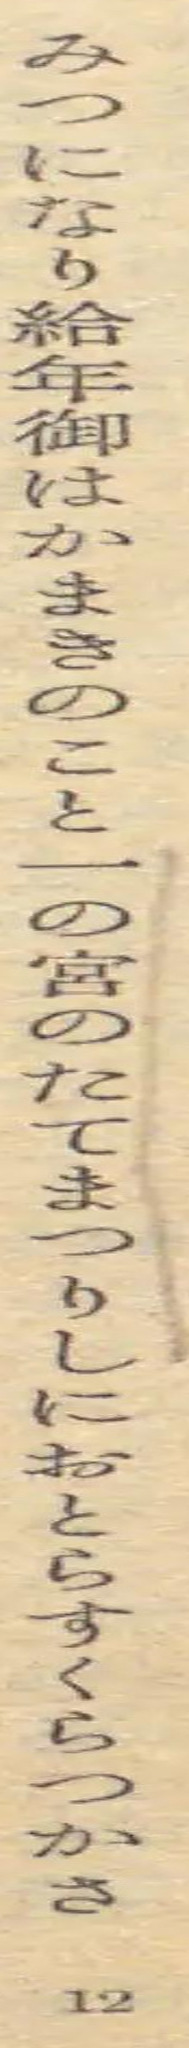みつになり給年御はかまきのこと一の宮のたてまつりしにおとらすくらつかさ
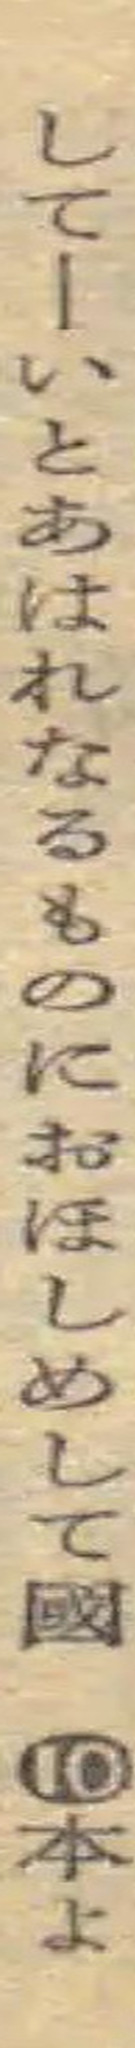して―いとあはれなるものにおほしめして国❿本よ
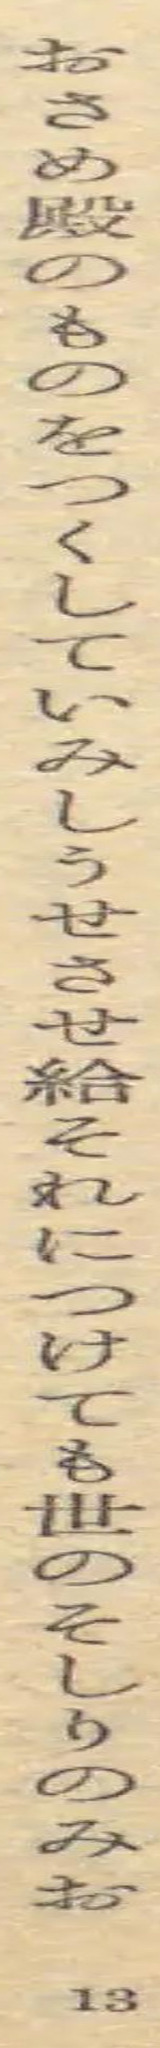おさめ殿のものをつくしていみしうせさせ給それにつけても世のそしりのみお
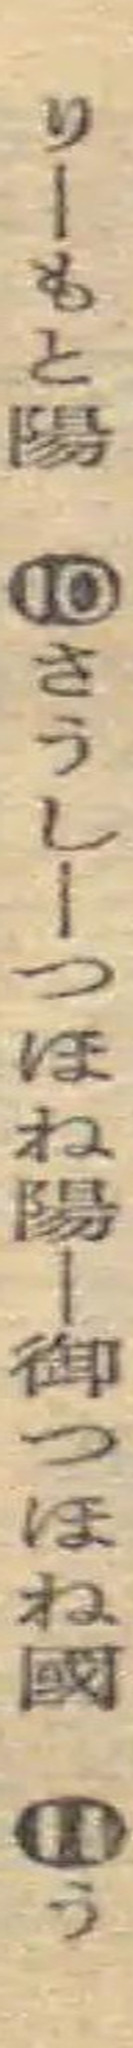り―もと陽❿さうし―つほね陽―御つほね国⓫う
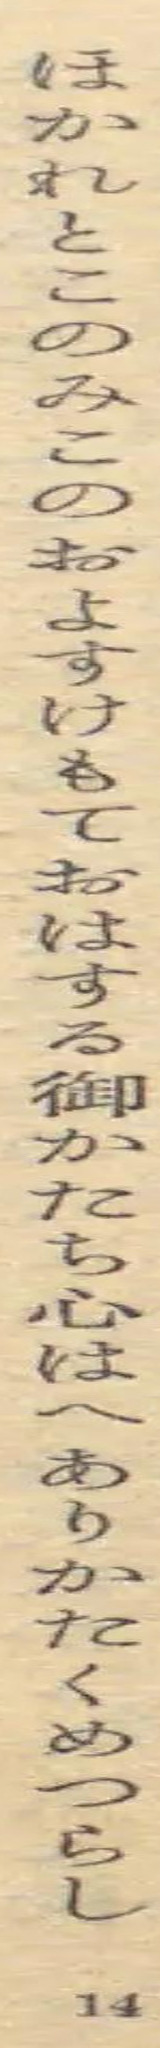ほかれとこのみこのおよすけもておはする御かたち心はへありかたくめつらし
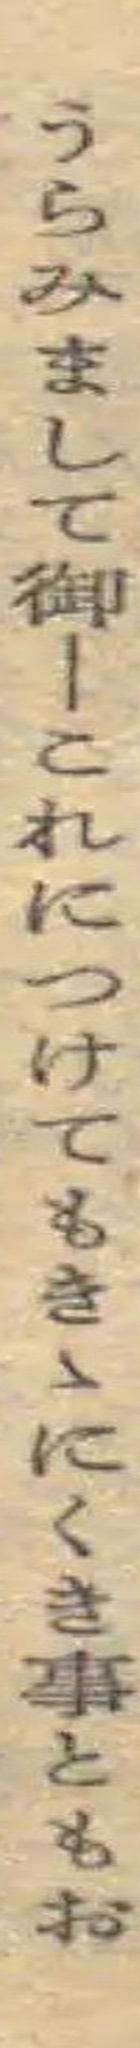うらみまして御―これにつけてもきゝにくき事ともお
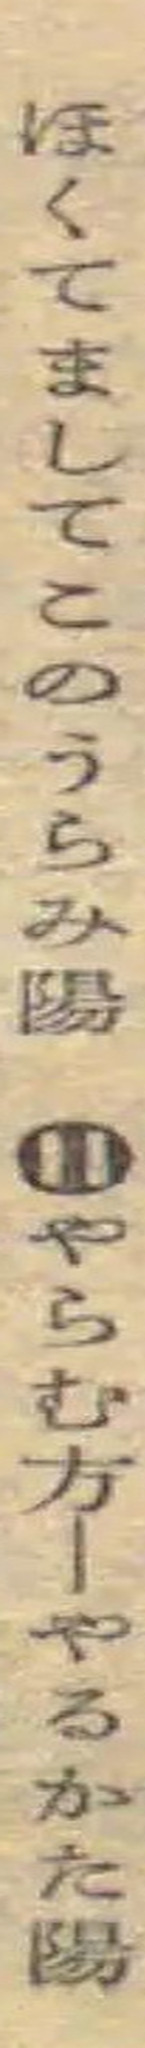ほくてましてこのうらみ陽⓫やらむ方―やるかた陽
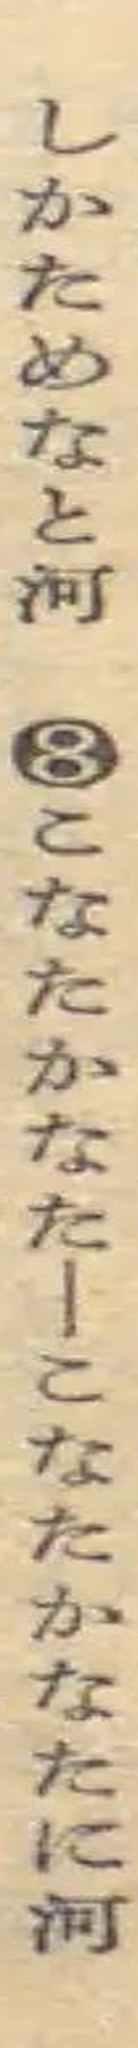しかためなと河❽こなたかなた―こなたあなたに河
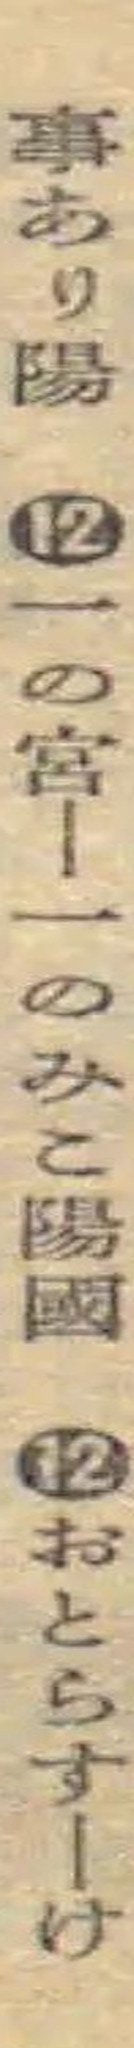事あり陽⓬一の宮―一のみこ陽国⓬おとらす―け
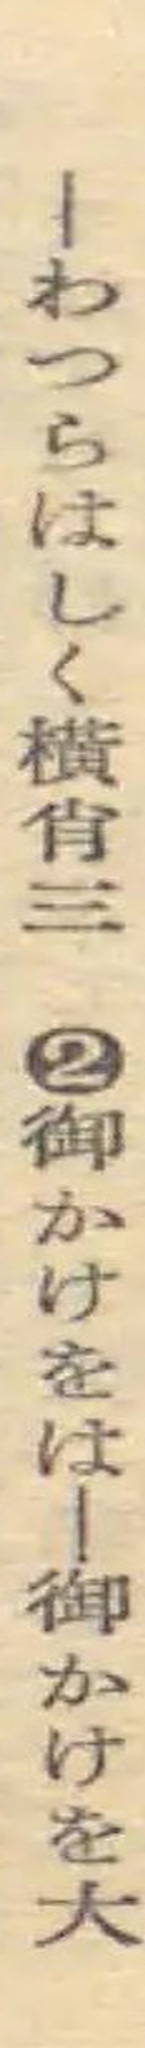―わつらはしく横肖三➋御かけをは―御かけを大
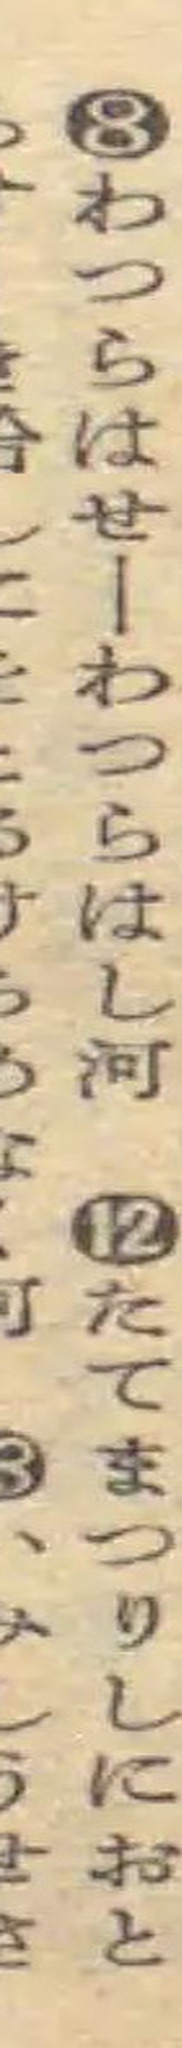❽わつらはせ―わつらはし河⓬たてまつりしにおと
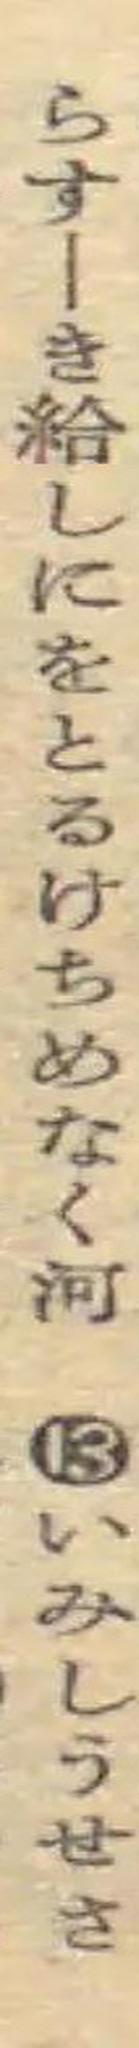らす―き給しにをとるけちめなく河⓭いみしうせさ
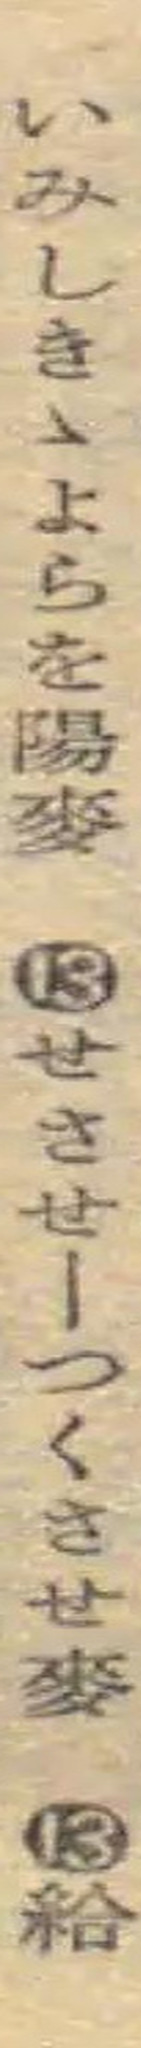いみしきゝよらを陽麦⓭せさせ―つくらせ麦⓭給
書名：校異源氏物語.
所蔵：国立国会図書館 National Diet Library, JAPAN
